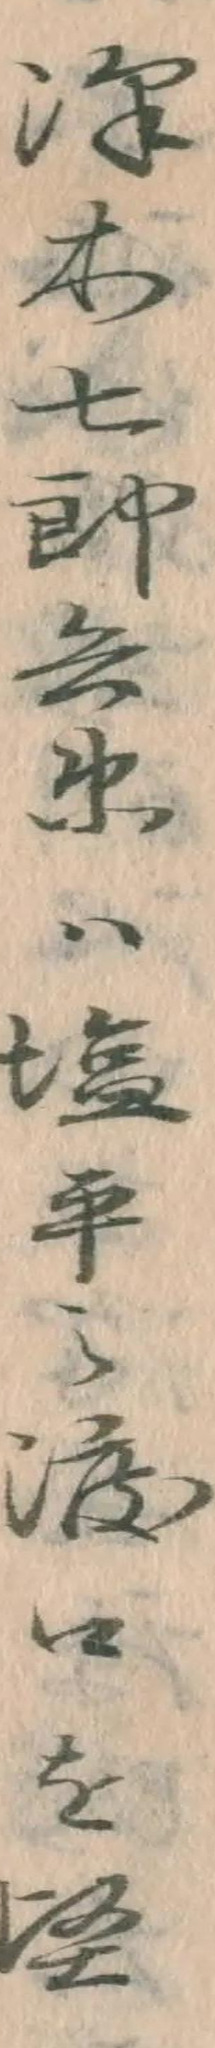沢木七郎兵衛は塩平之渡口を堅
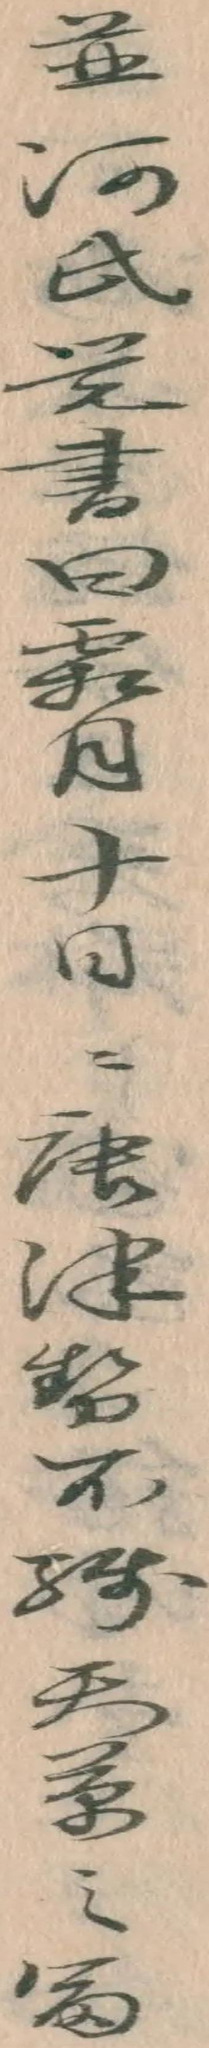並河氏覚書曰霜月十日に唐津勢不残天草之冨
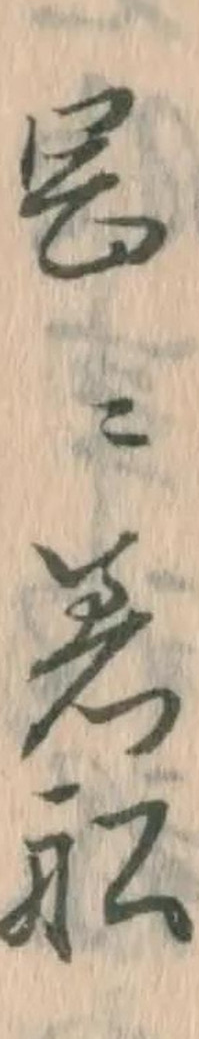岡に着舩
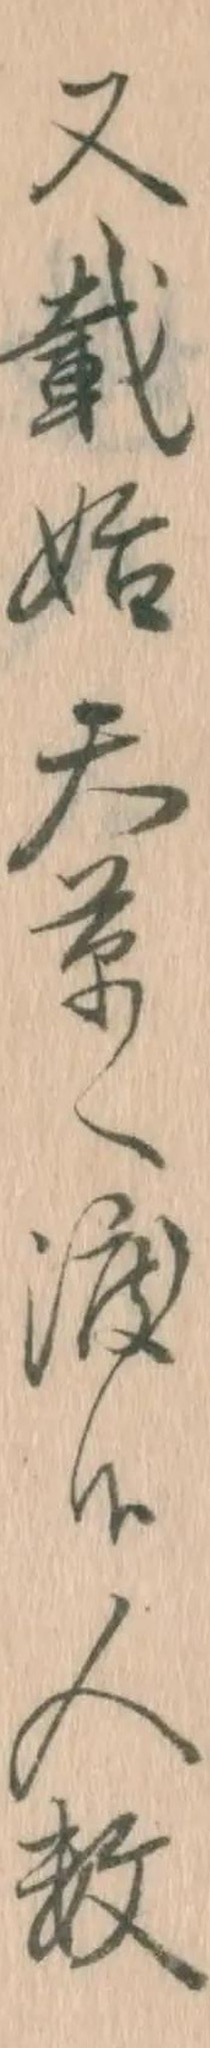又載始天草へ渡候人数
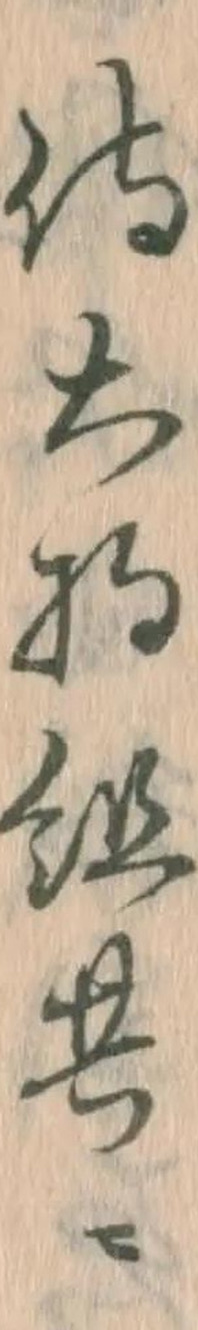侍大将組共に
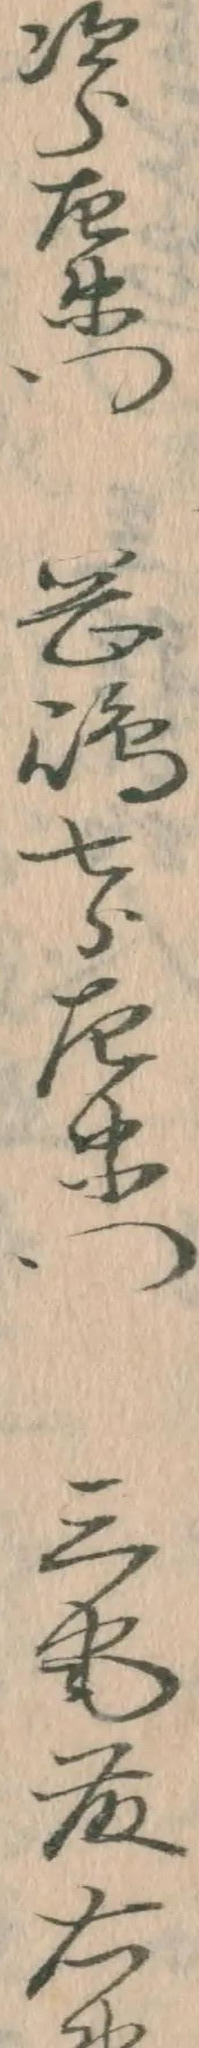岡島次郎左衛門岡島七郎左衛門三宅藤右衛門
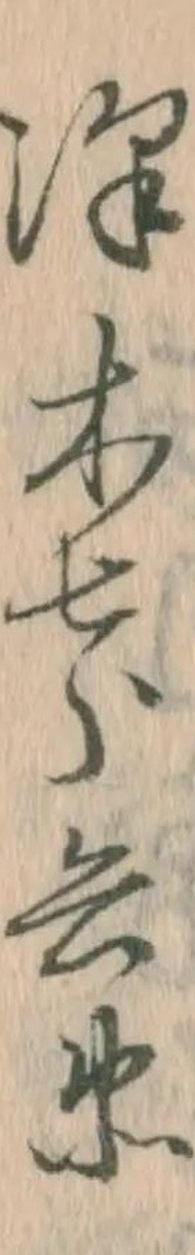沢木七郎兵衛
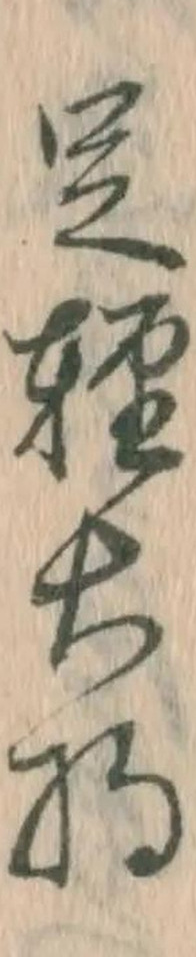足軽大将
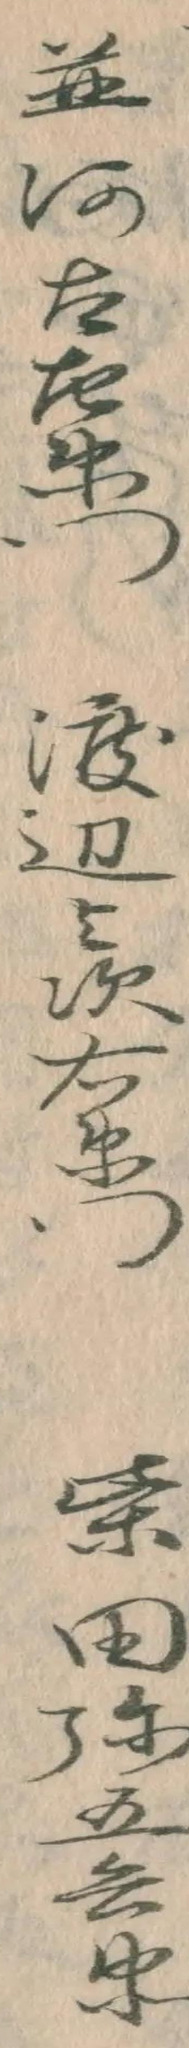並河太郎左衛門渡辺与次右衛門柴田弥五兵衛
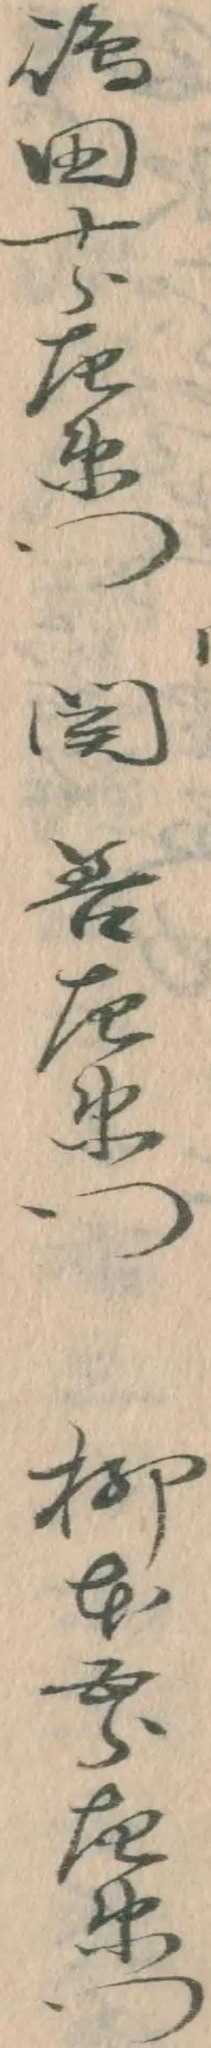島田十郎左衛門関善左衛門柳本五郎左衛門
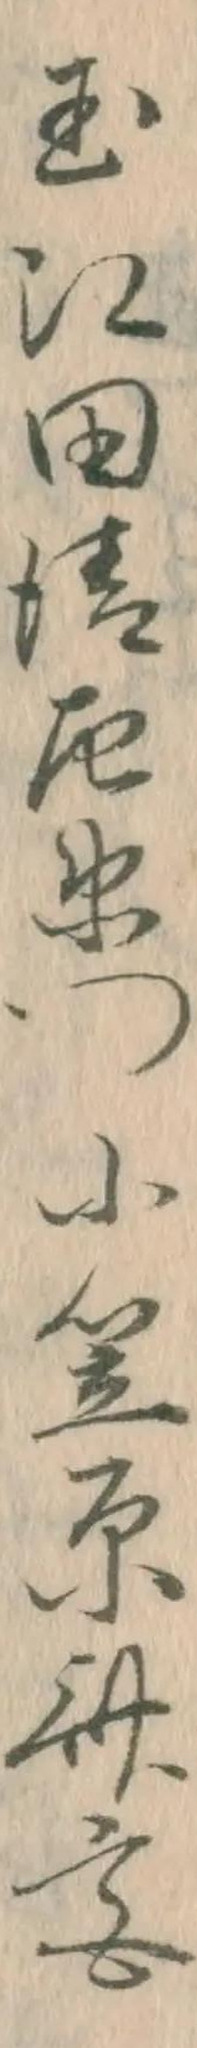国江田清左衛門小笠原斎宮
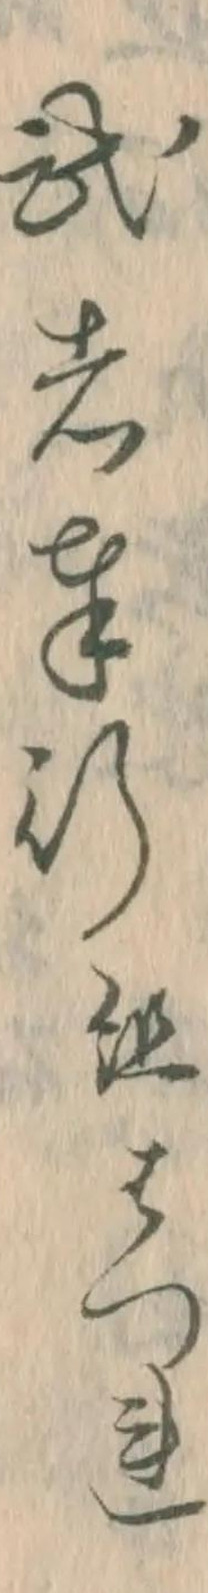武者奉行組はつ連

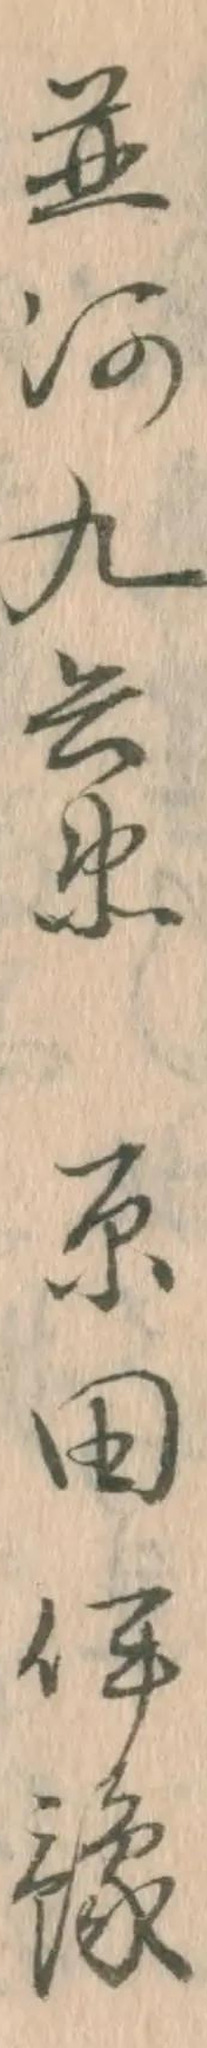並河久兵衛原田伊予
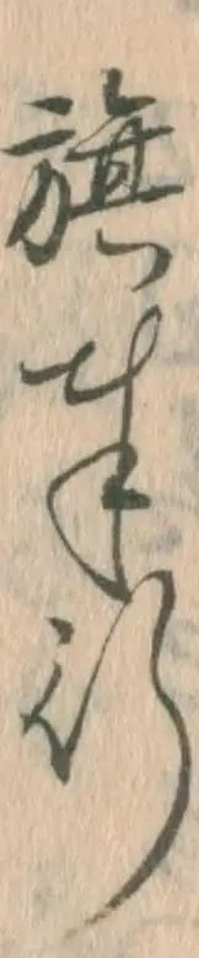旗奉行
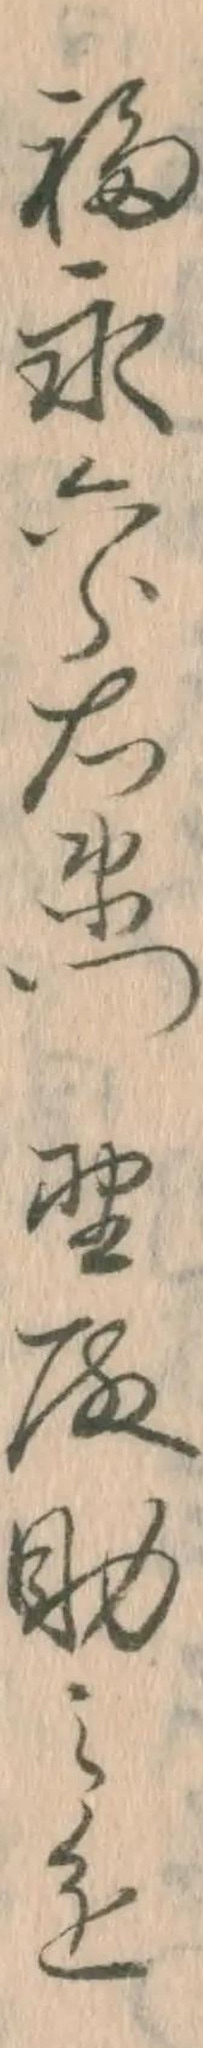福永六郎右衛門野殿助之進
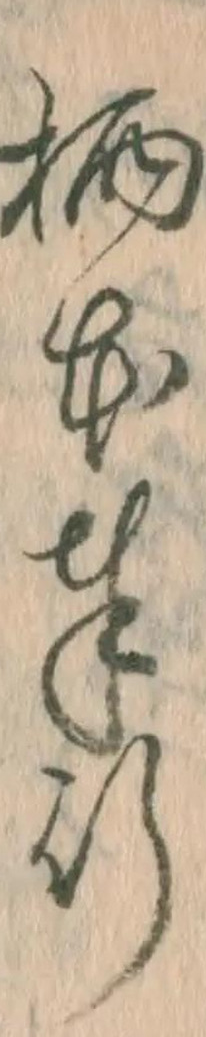栖本奉行
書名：切支丹御退治記 49巻. [2]
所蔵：国立国会図書館 National Diet Library, JAPAN
